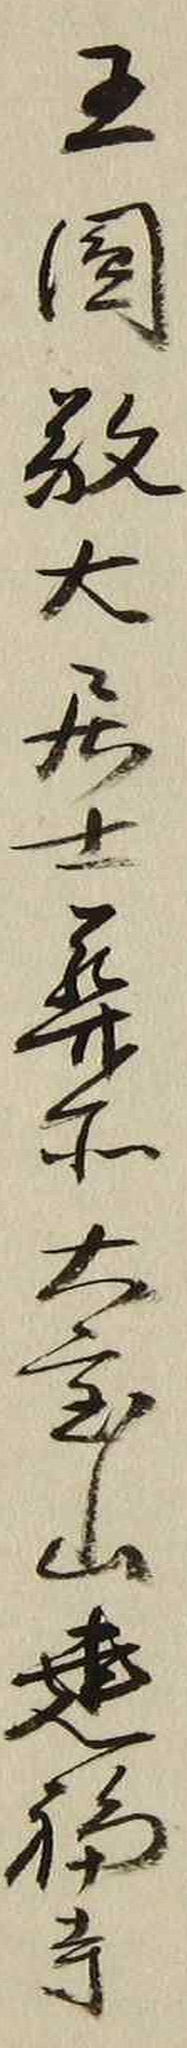王円敬大居士葬所大宝山建福寺
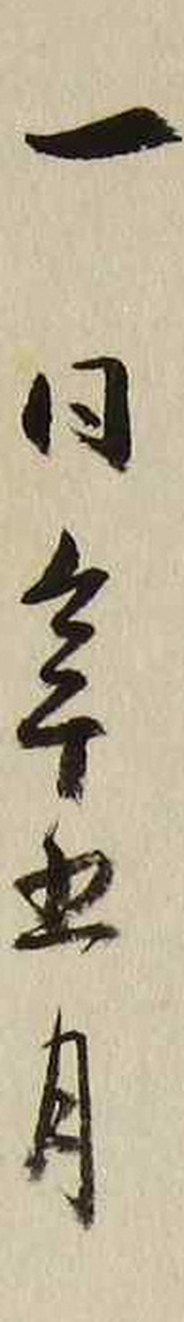一同年五月
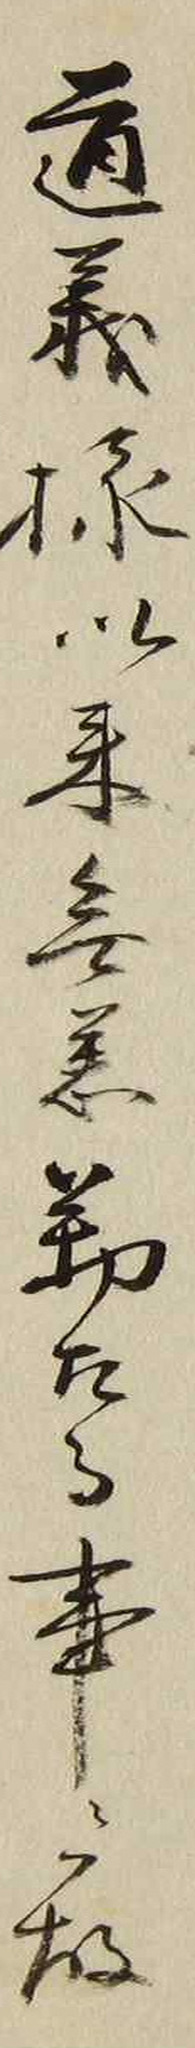道義様以来無恙勤たる事に候故
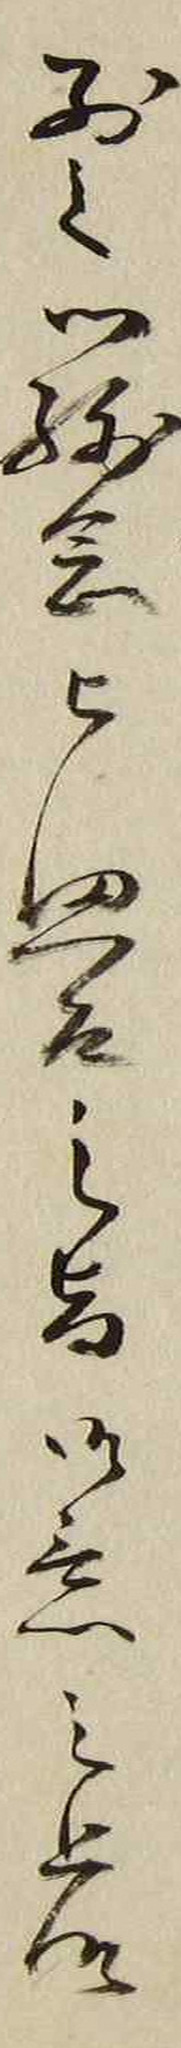別て御残念被思召之旨御意之上御
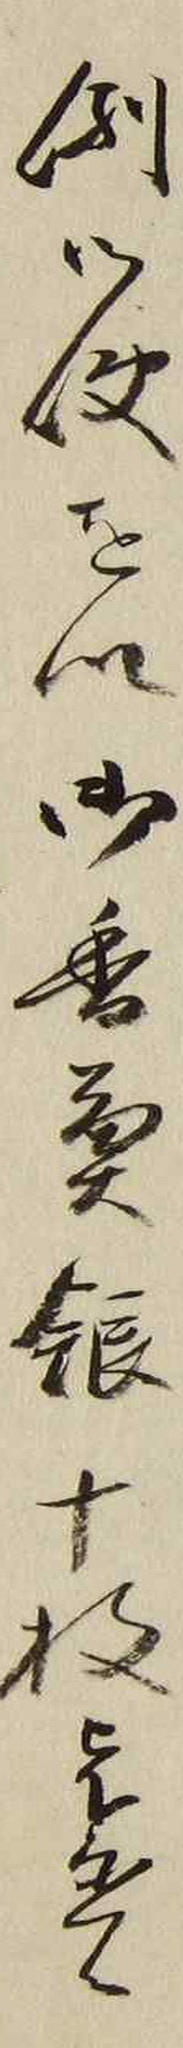側御使を以御香典銀十枚被下置候
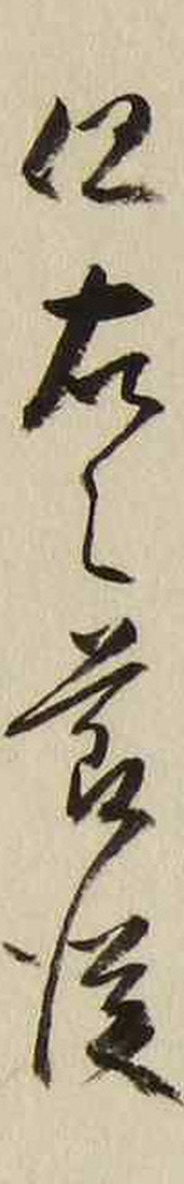但右之節従

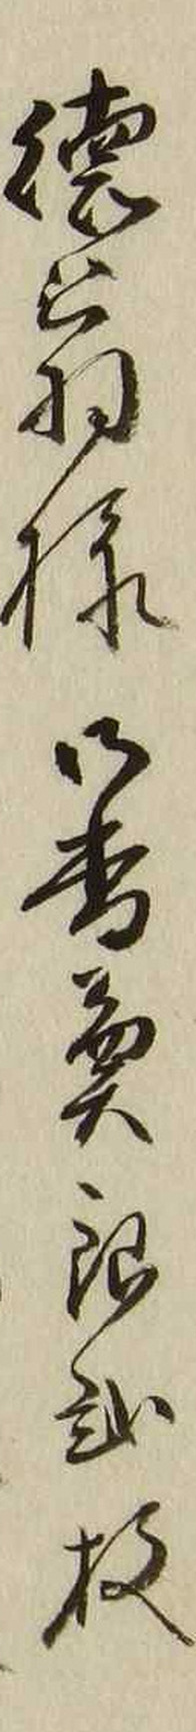徳翁様御香典銀弐枚
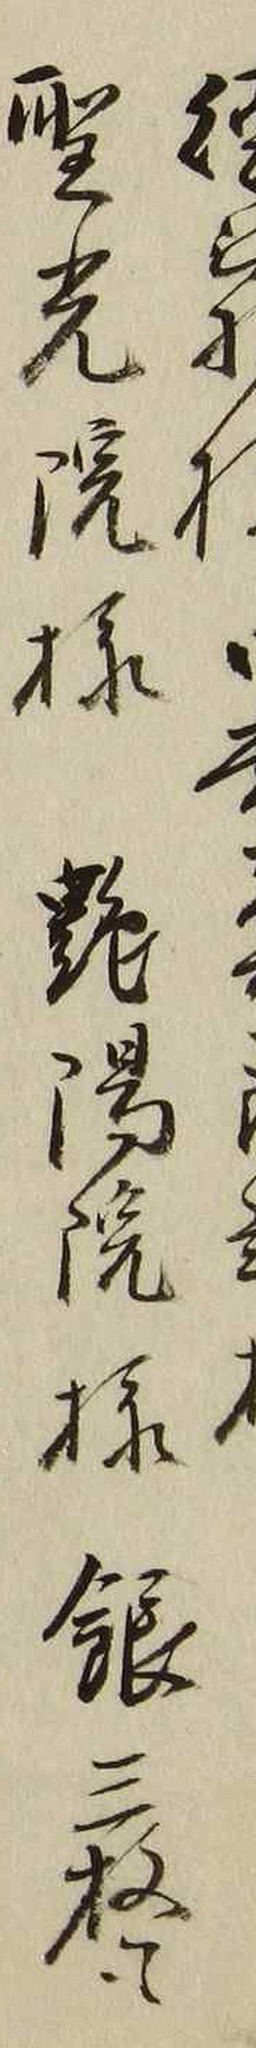聖光院様艶陽院様銀三枚つゝ
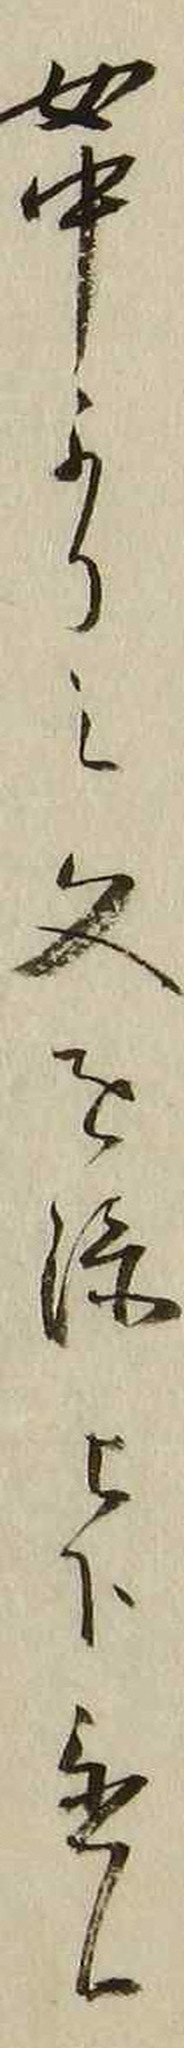女中より之文を添下置候
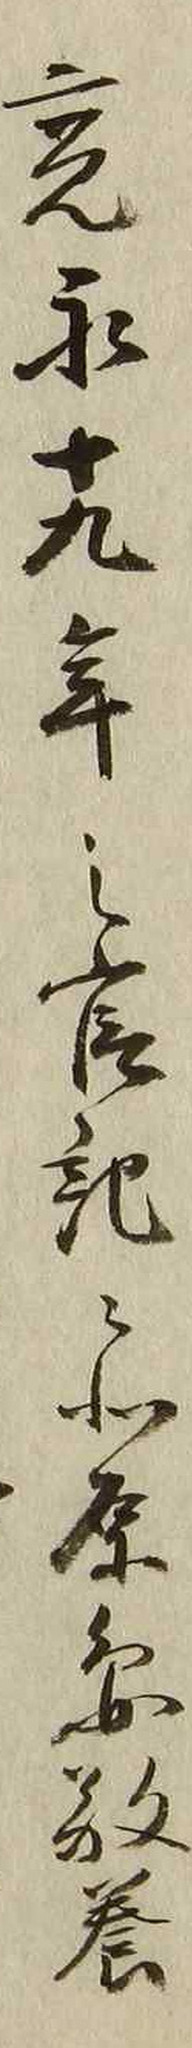寛永十九年之官記に北原円敬養
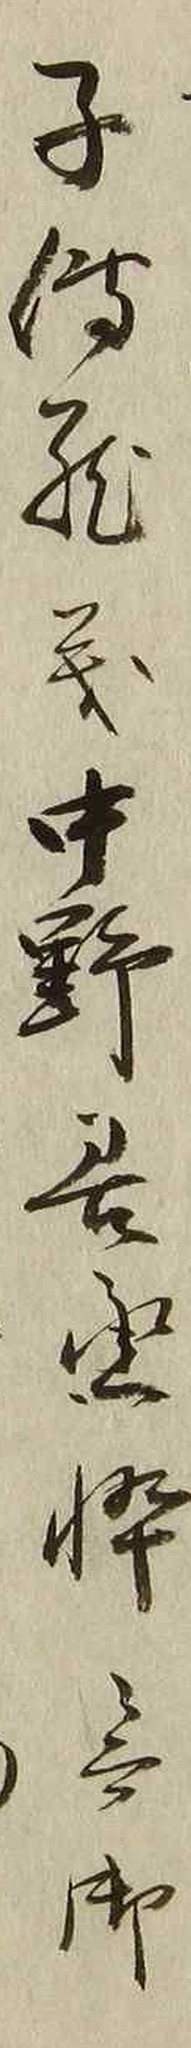子伝蔵義中野善丞忰に而御
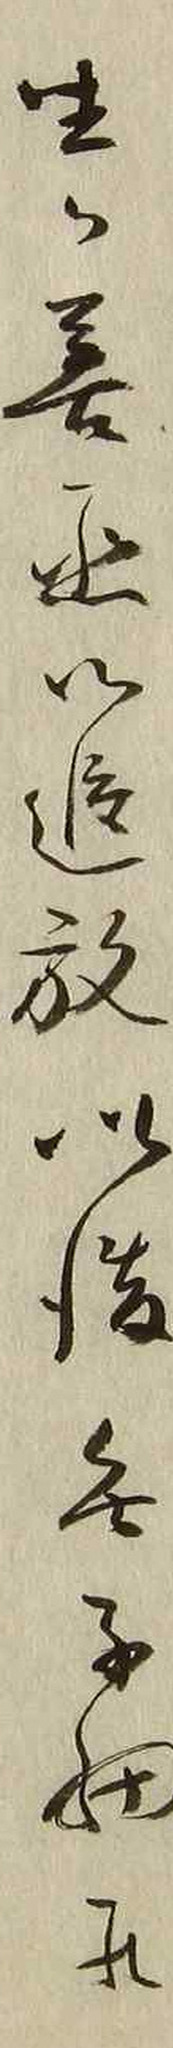座候善丞御追放以後其子細罷
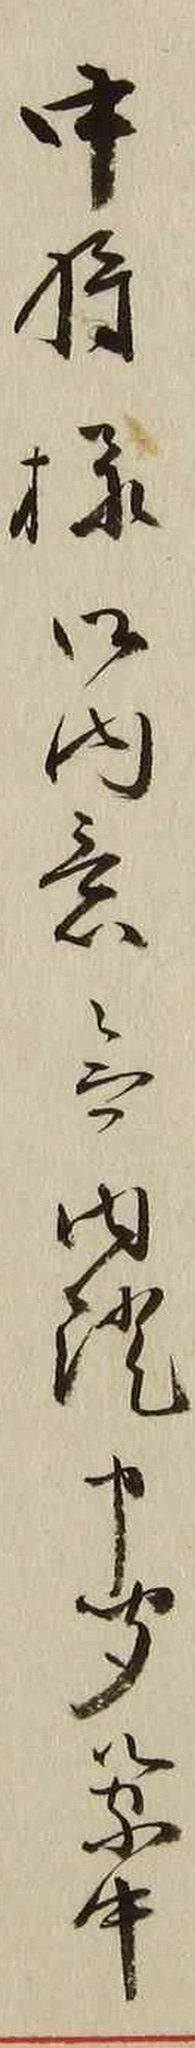中将様御内意に而内証申聞御家中
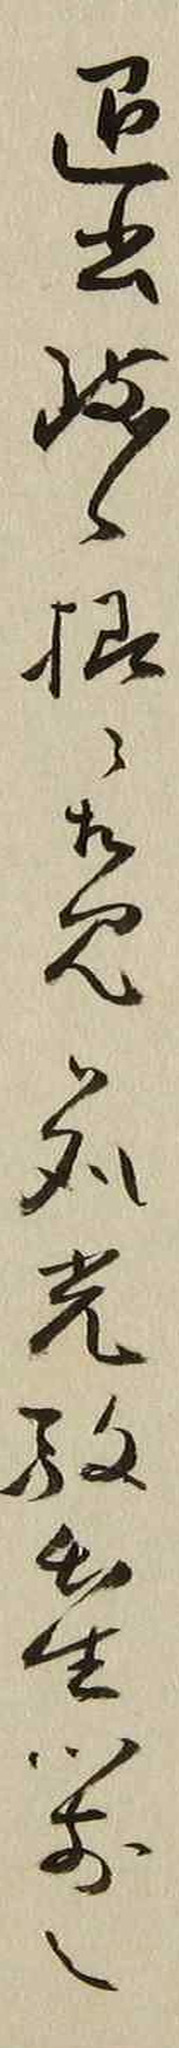退出致候様に相見候処光敬出生以前之
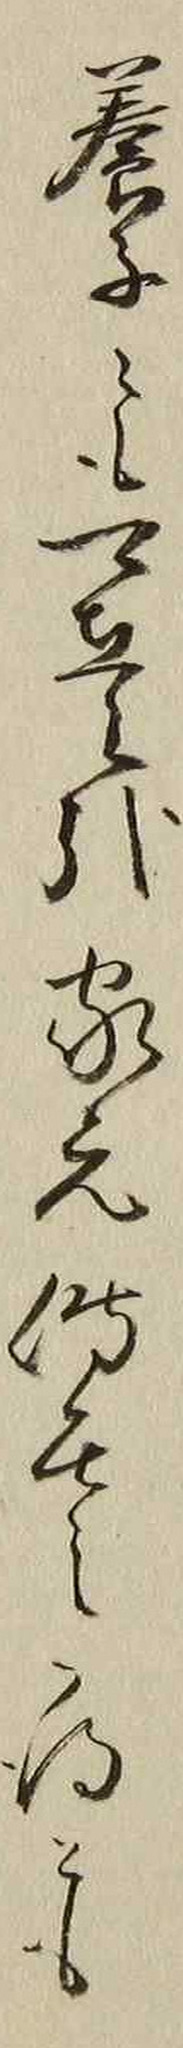養子にも可在候哉家元伝無之候得とも
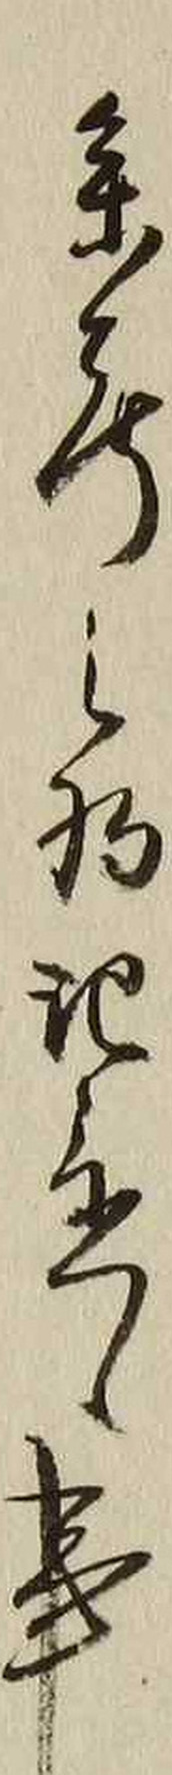参考之為記置候事
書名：諸士系譜　巻之292　き之部1
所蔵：会津若松市立会津図書館
